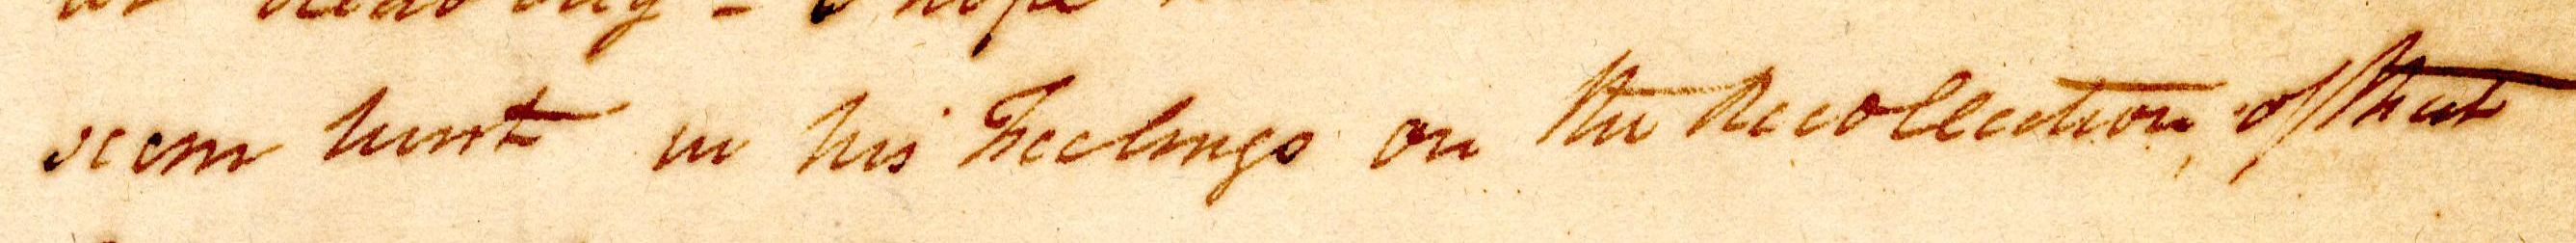seem hurt in his Feeling on the Recollection of that
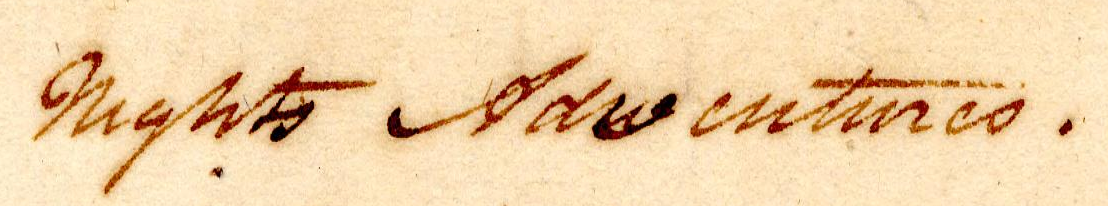Nights Adventures.
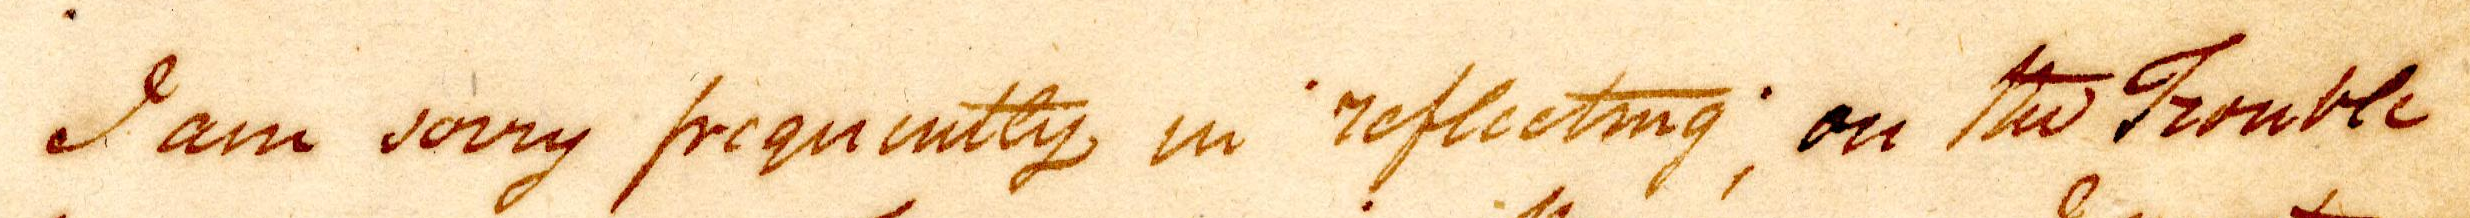I am sorry frequently in reflecting on the Trouble
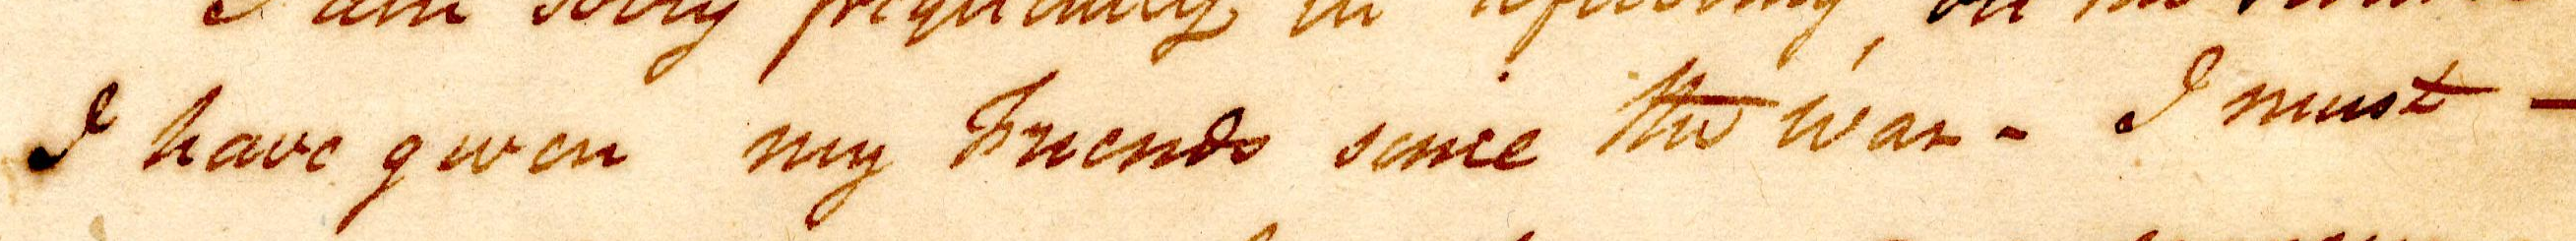I have given my Friends since the war. I must
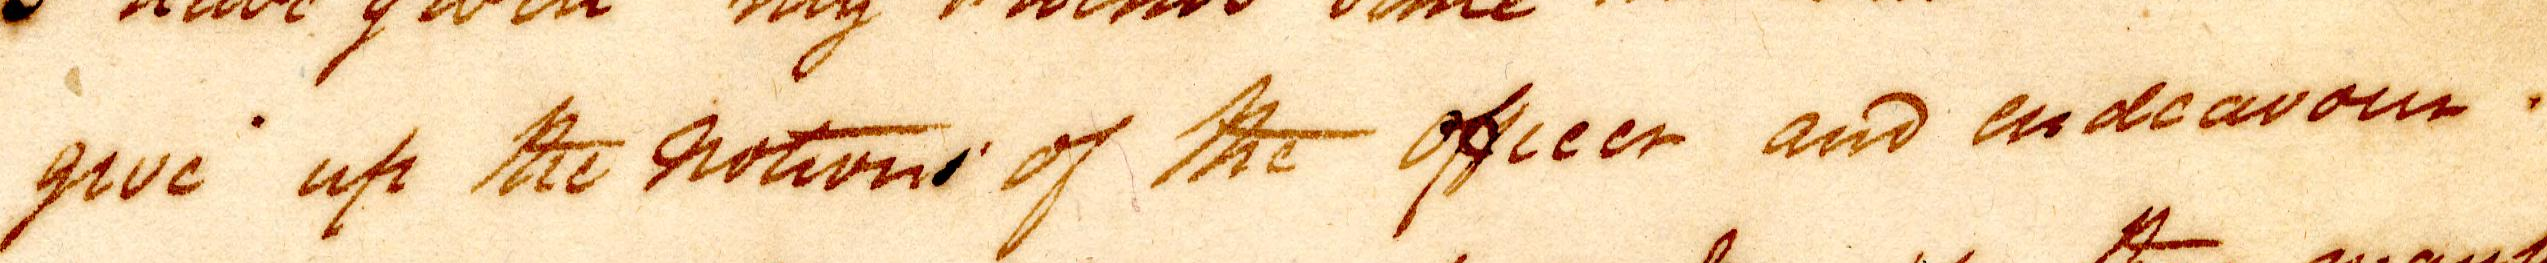give up the Notions of the officer and endeavour
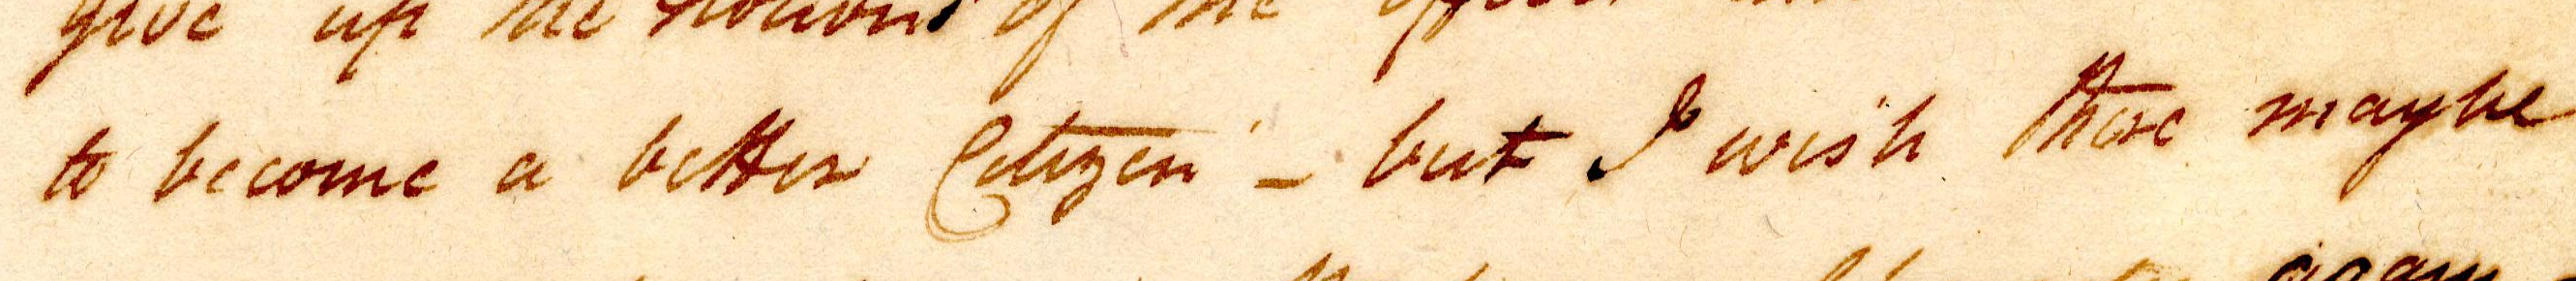to become a better Citizen, but I wish those maybe
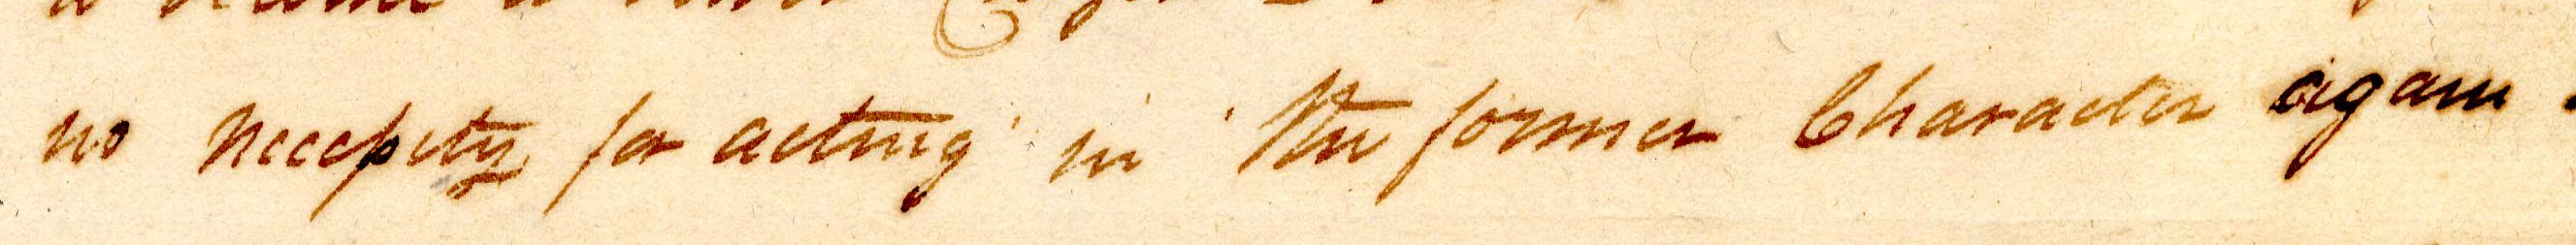no necessity for acting in the former Character again.
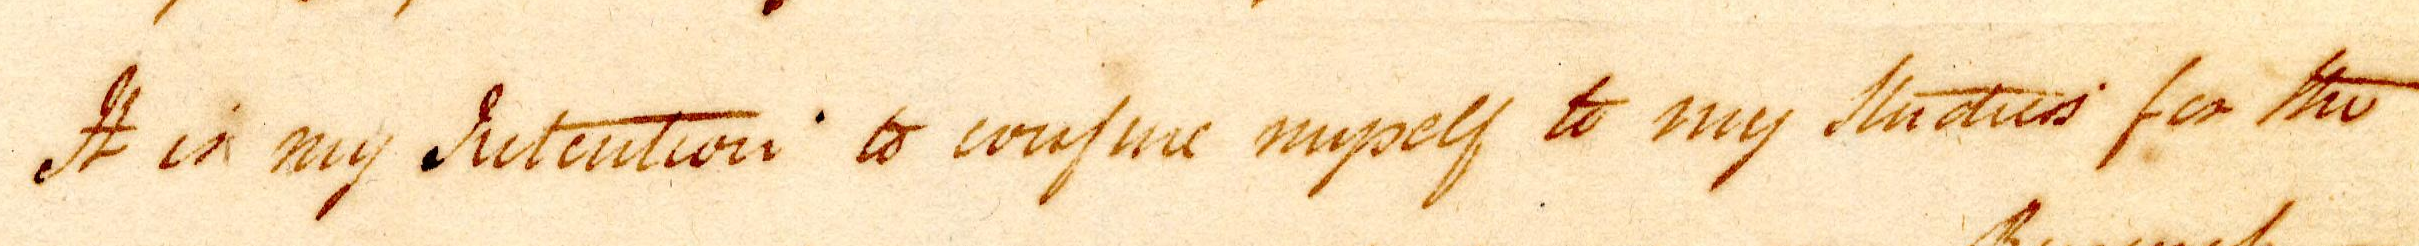It is my Intention to conjure myself to my Studies for the
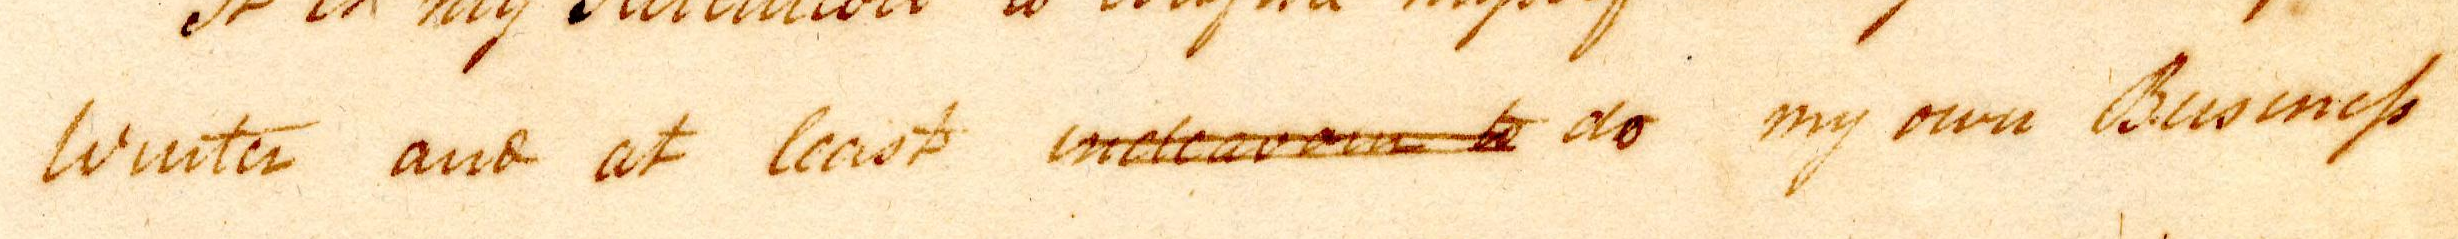winter and at least indeavour to do my own Business.
